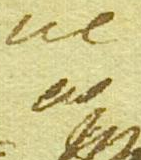as
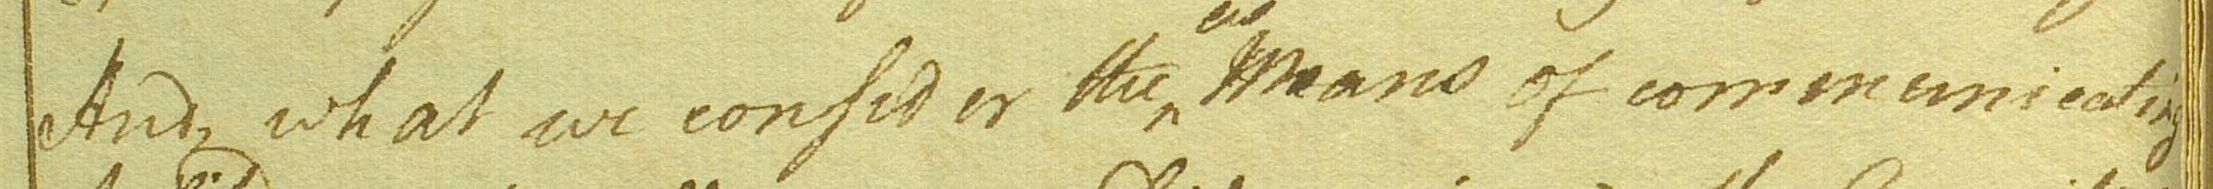And, what we consider the ^ Means of communicating
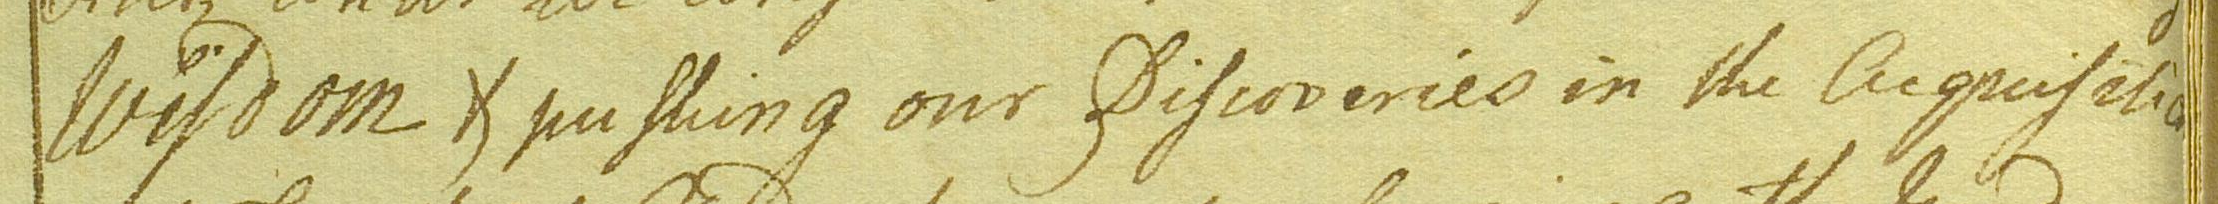Wisdom & pushing our Discoveries in the Acquisition
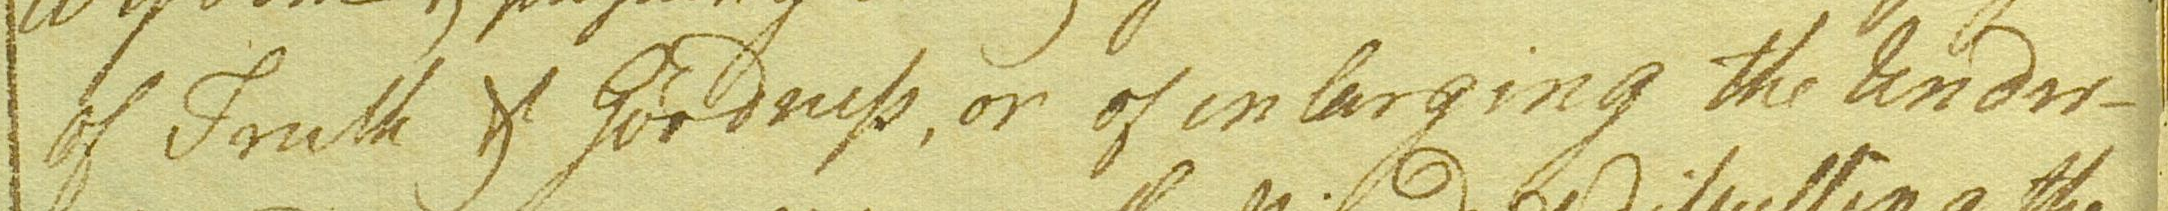of Truth & Goodness, or of inlarging the Under-
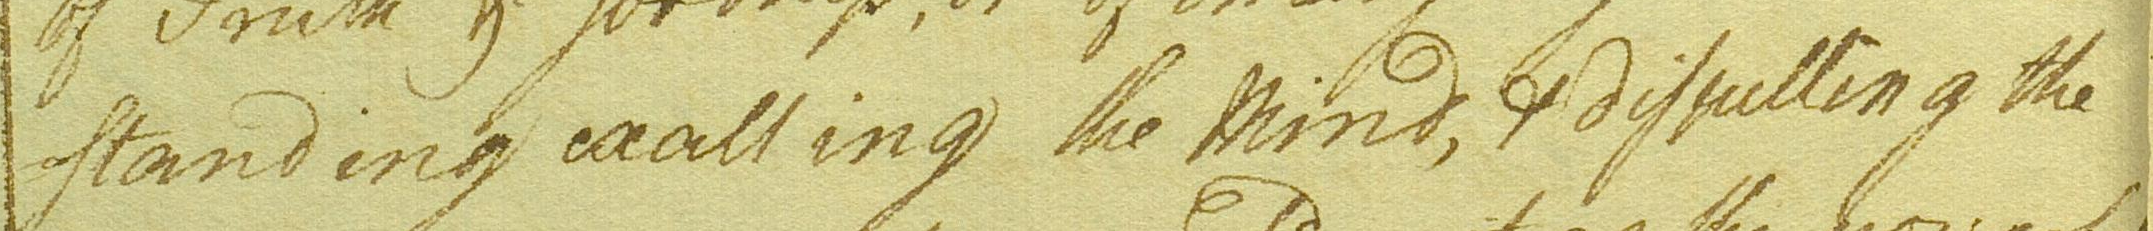standing exalting the Mind, & dispelling the
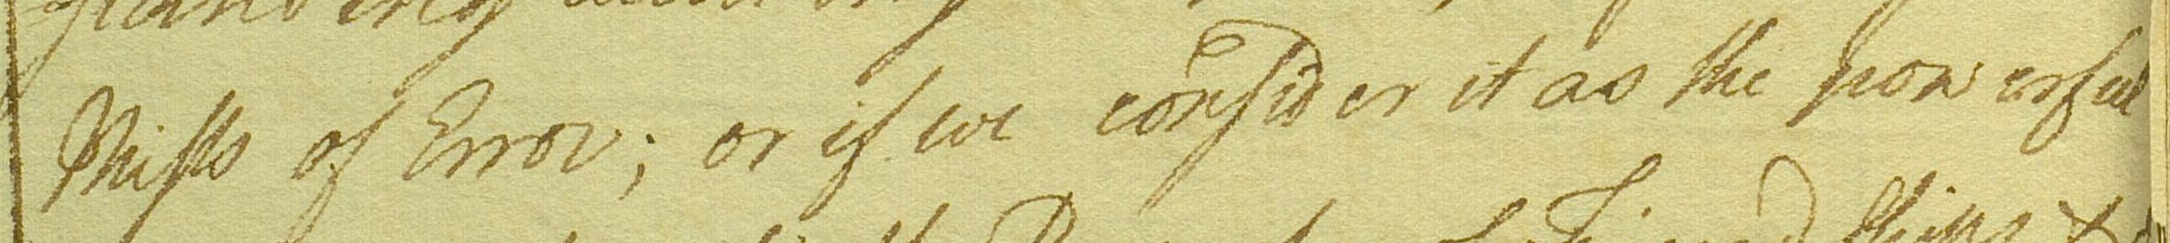Mists of Error; or if we consider it as the powerful
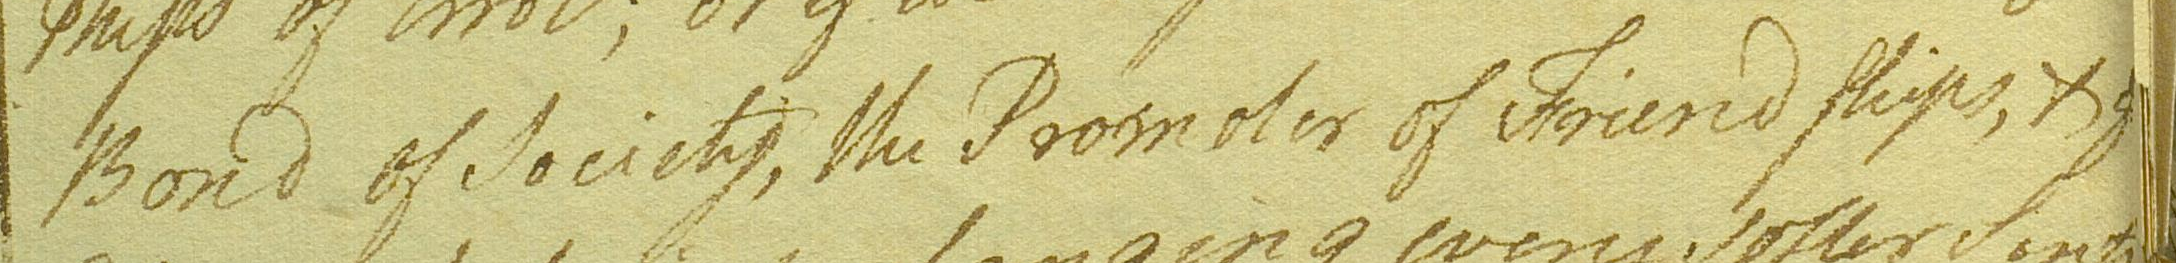Bond of Society, the Promoter of Friendships, & y^e
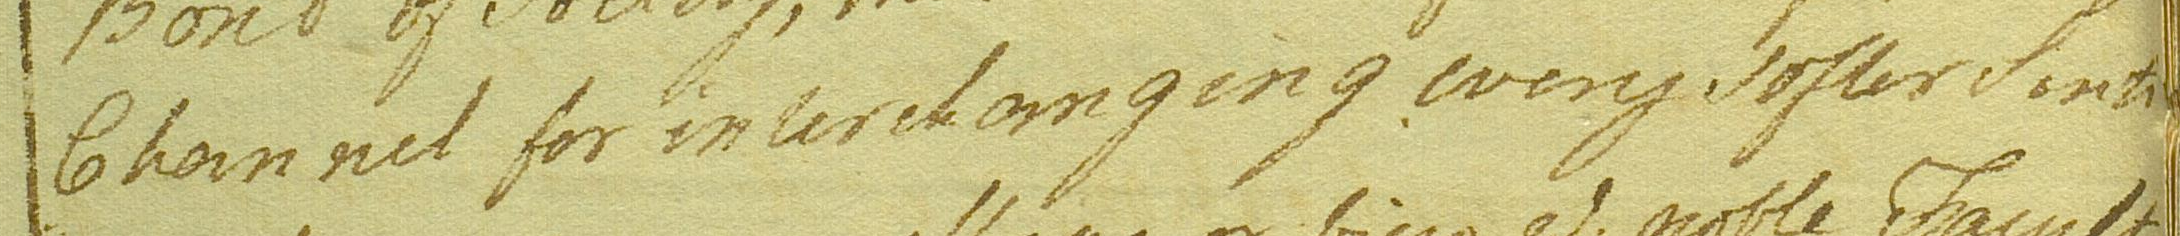Channel for interchanging every softer senti
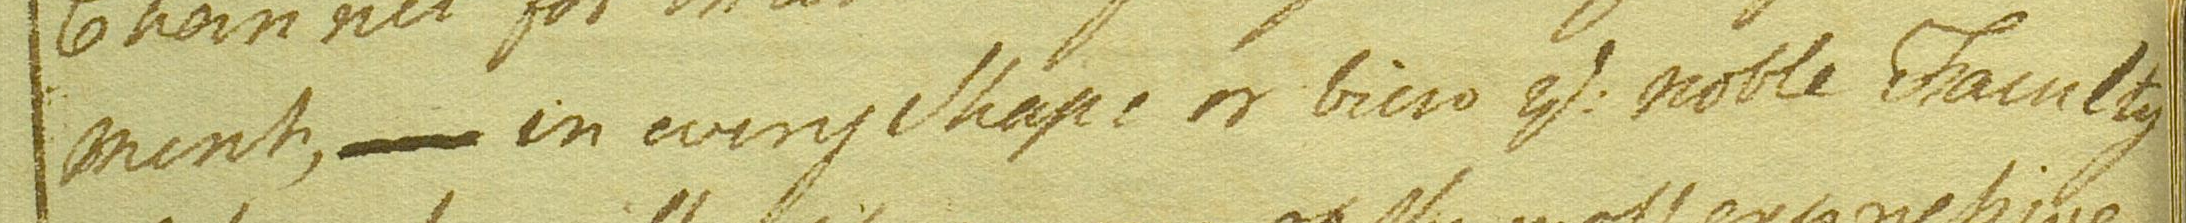ment,– in every Shape or View y^e: noble Faculty
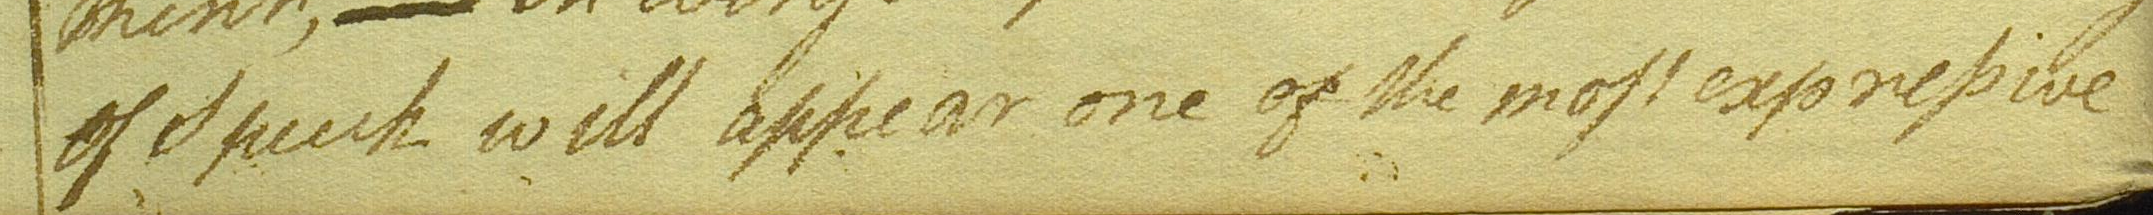of Speech will appear one of the most expresive
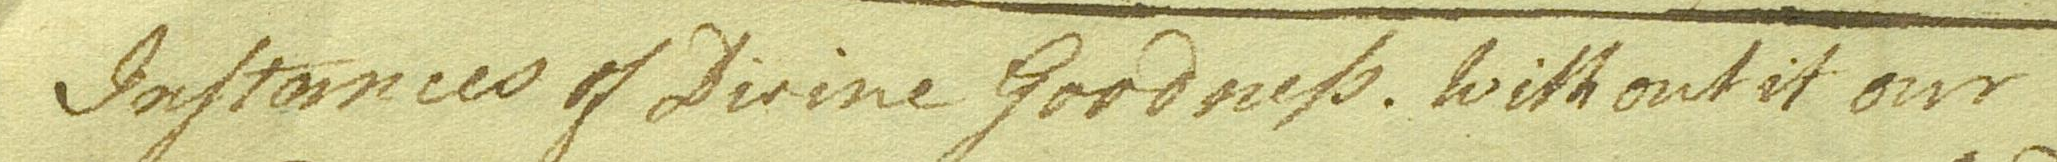Instances of Divine Goodness. Without it our
